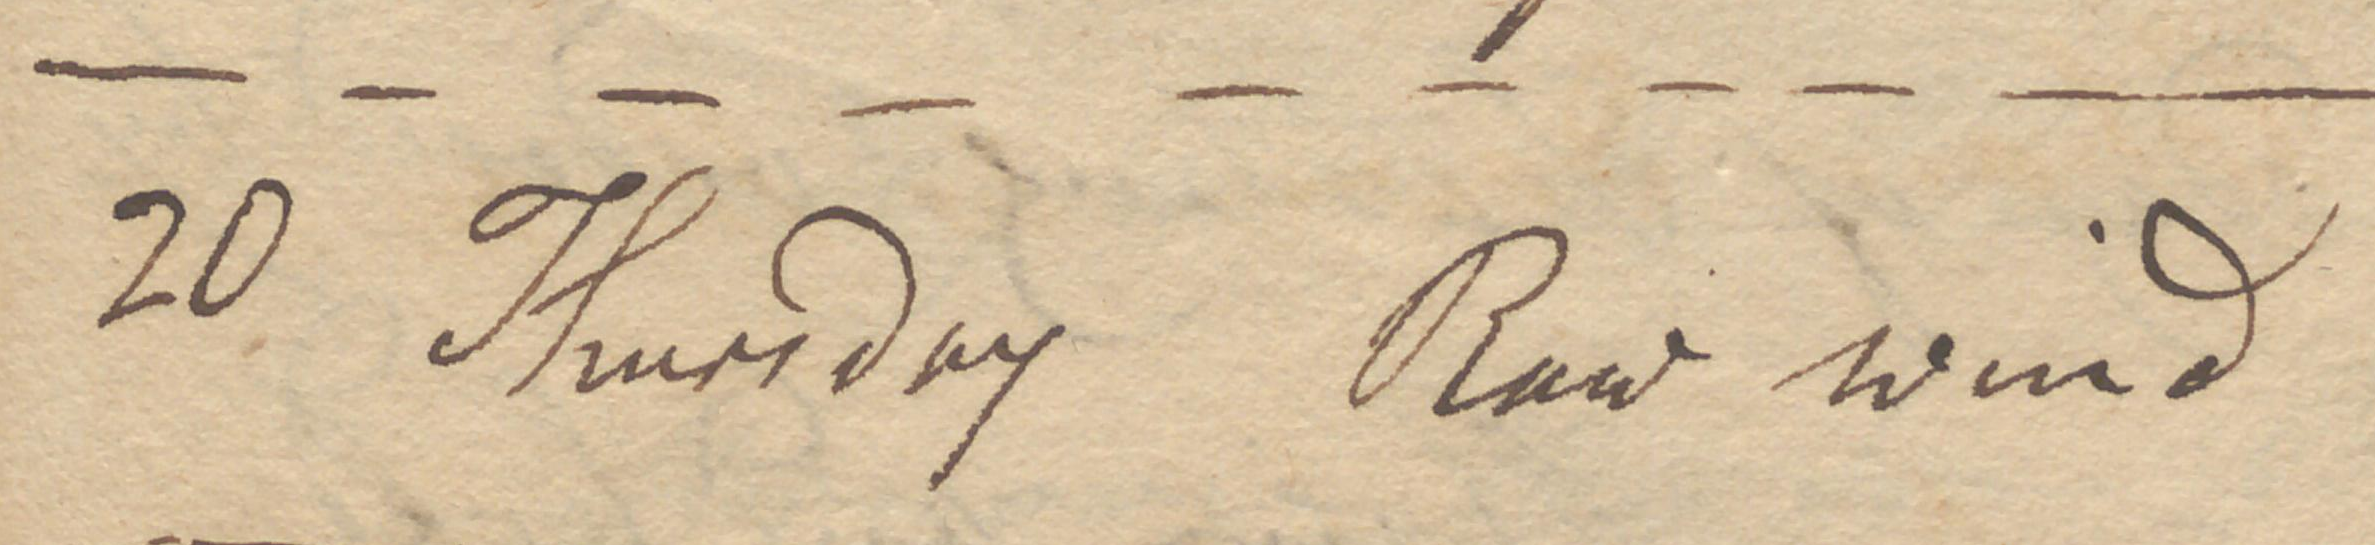20 Thursday Raw wind
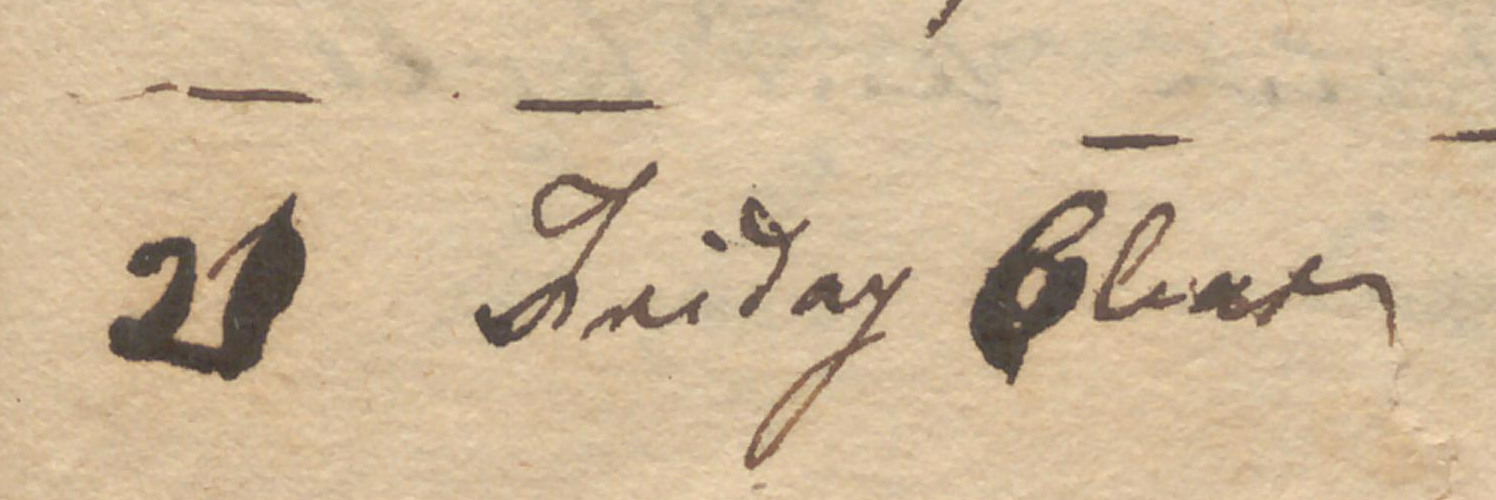21 Friday Clear
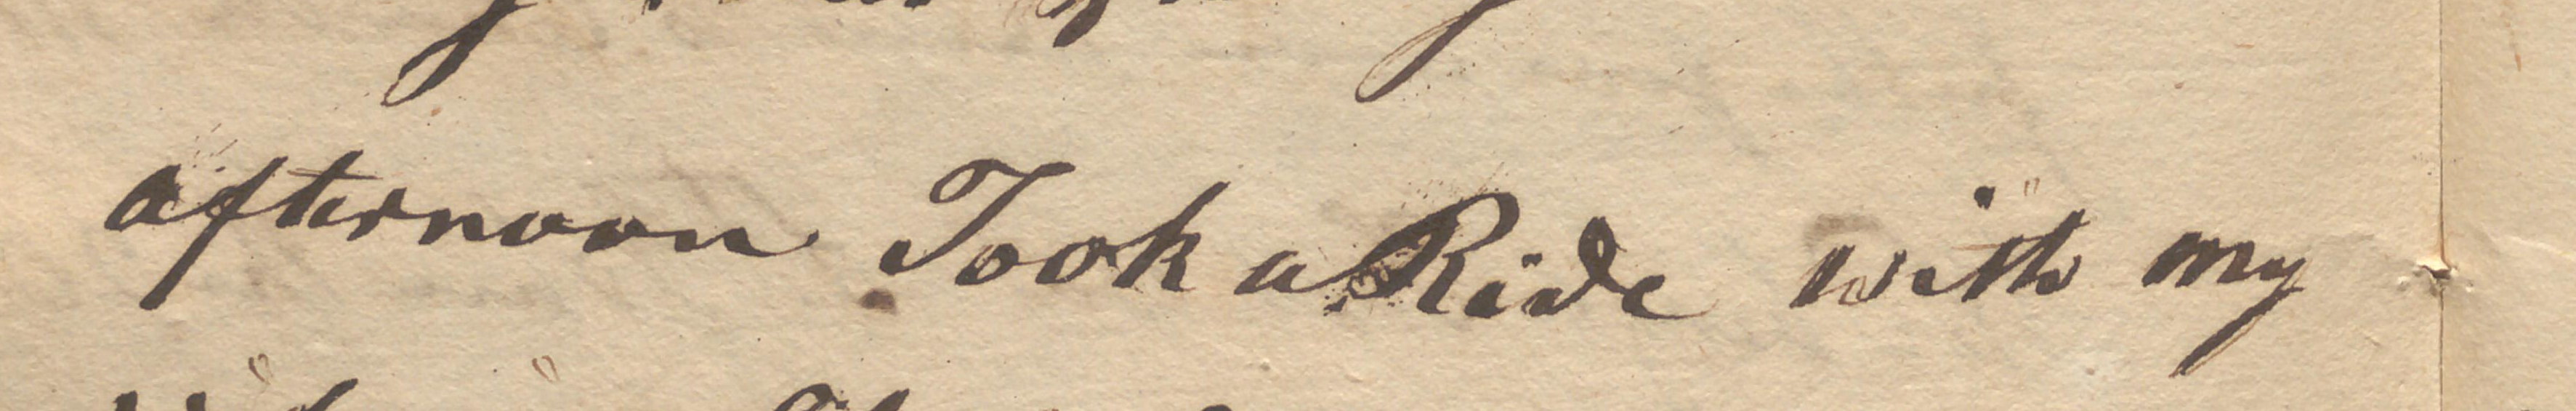afternoon Took a Ride with my
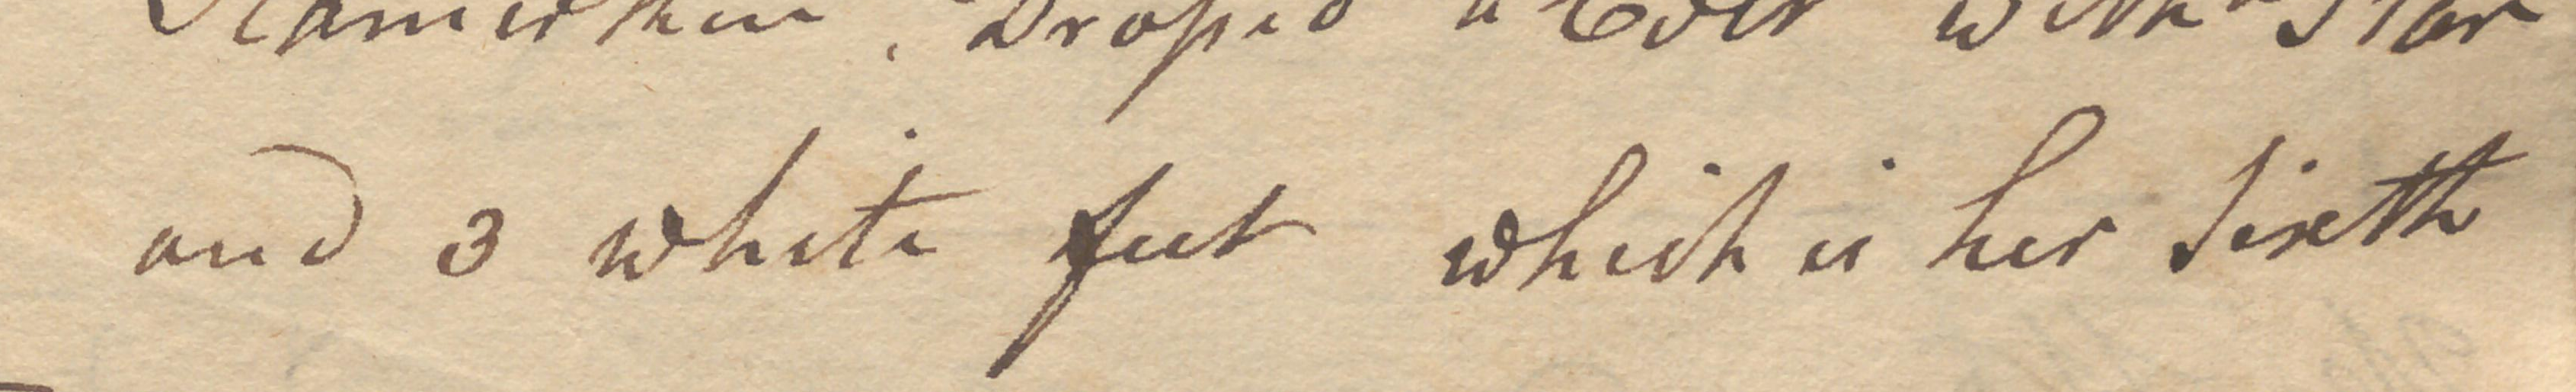and 3 white feet which is her Sixth
